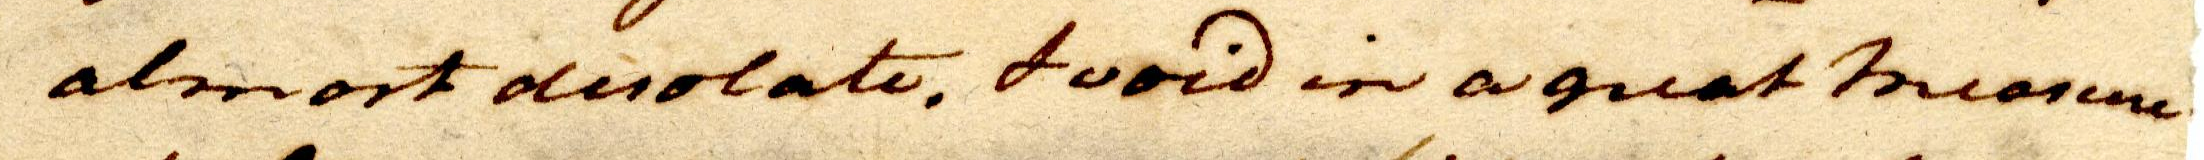almost desolate, & void in a great measure
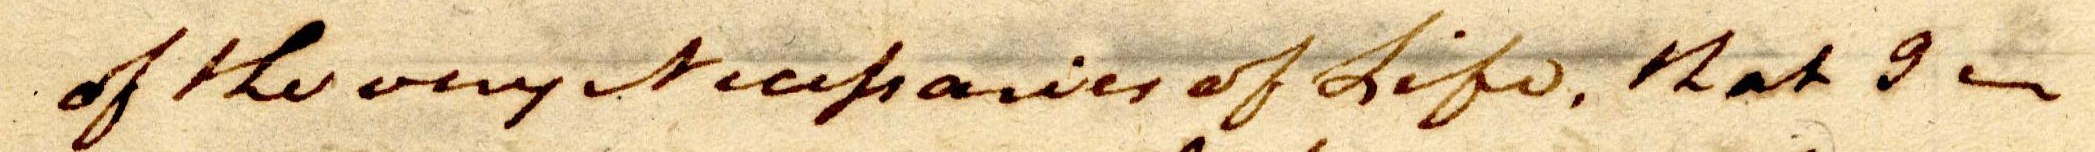of the very Necessaries of Life, that I-
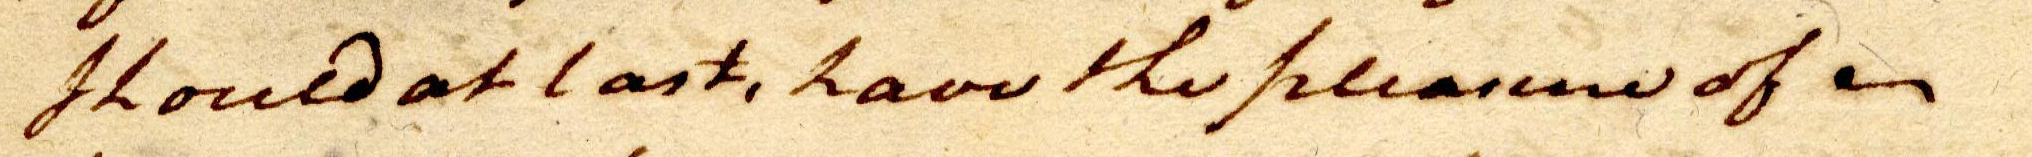should at last, have the pleasure of
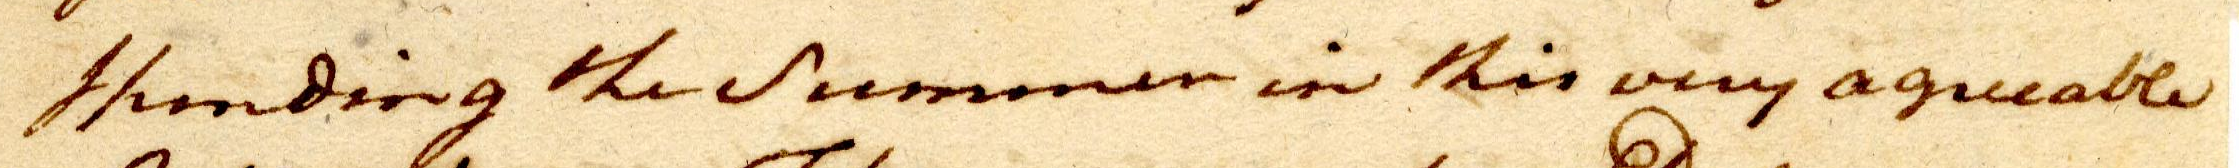spending the Summer in this very agreeable
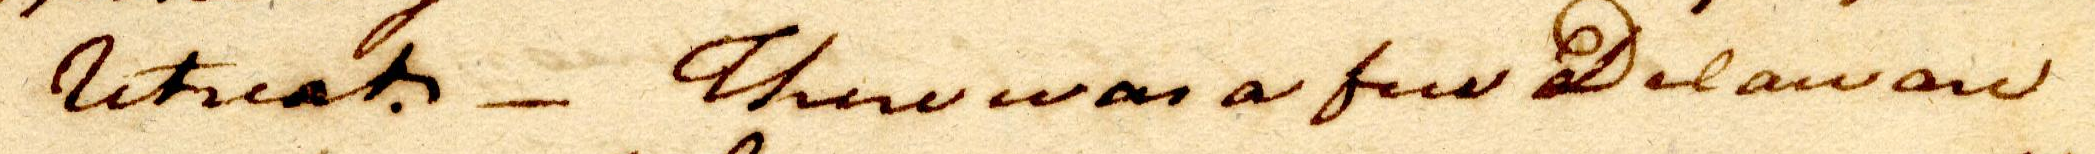retreat.- There was a few Delaware
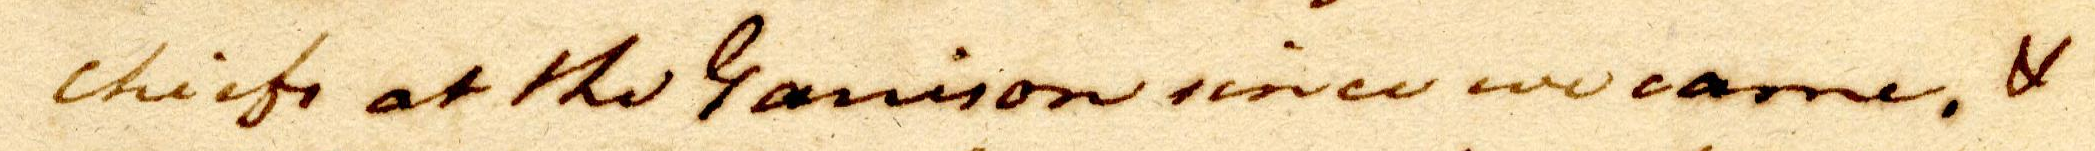chiefs at the Garrison since we came, &
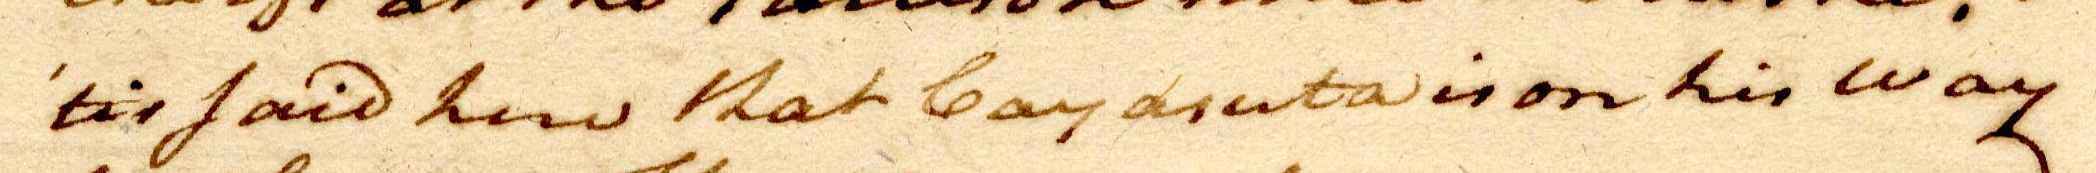'tis said here that Cayasuta is on his way
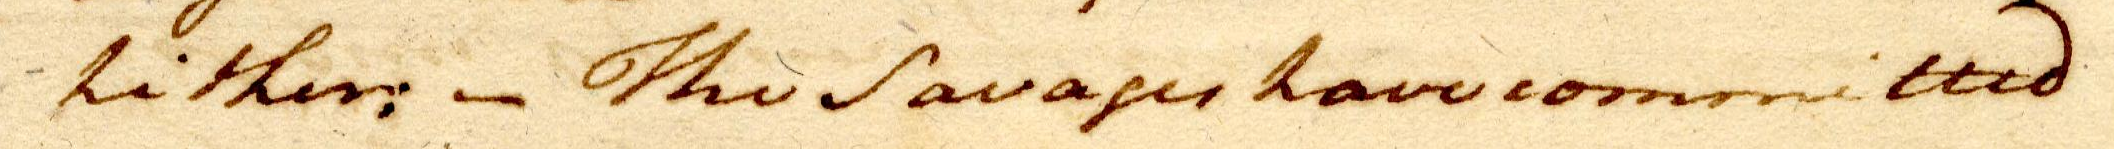hither;- The Savages have committed
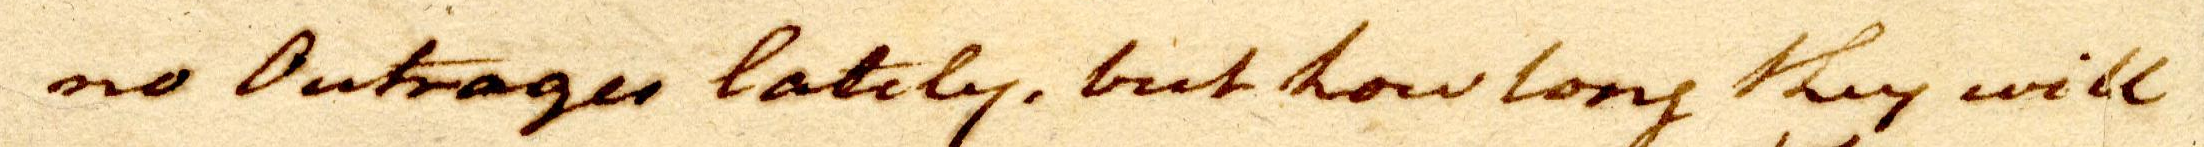no Outrages lately, but how long they will
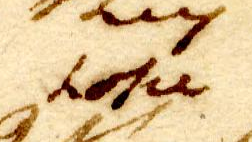hope
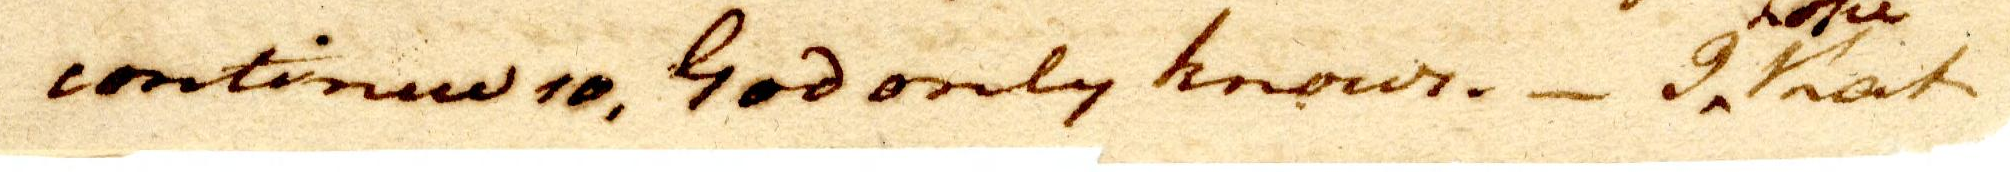continue so, God only knows.- I ^ that
